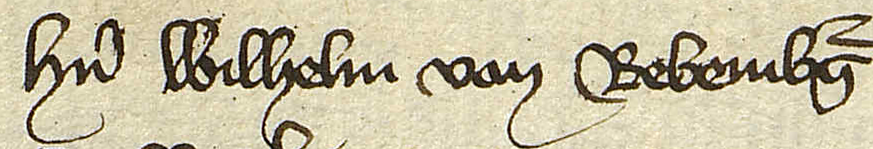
hn* Wilhelm von Bebemb*g
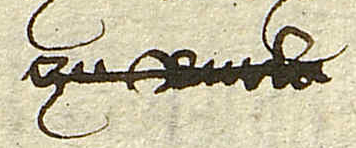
cʒu Burla
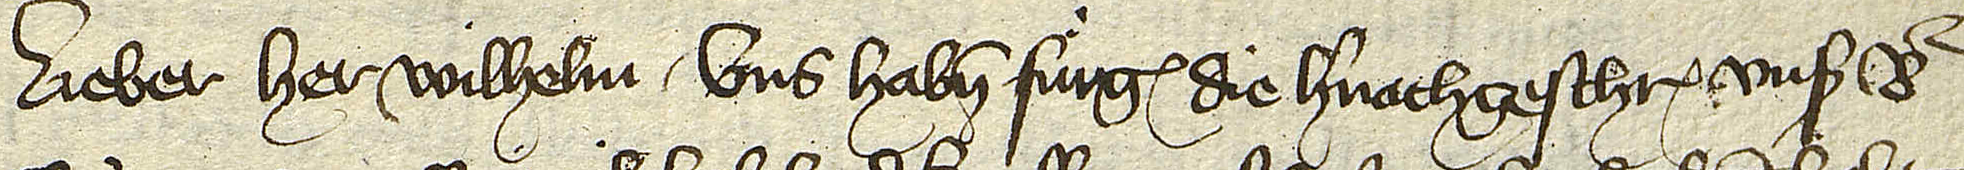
Lieber her wilhelm / vns habn* fürg* die h*nach geſchr* vnſ* B*
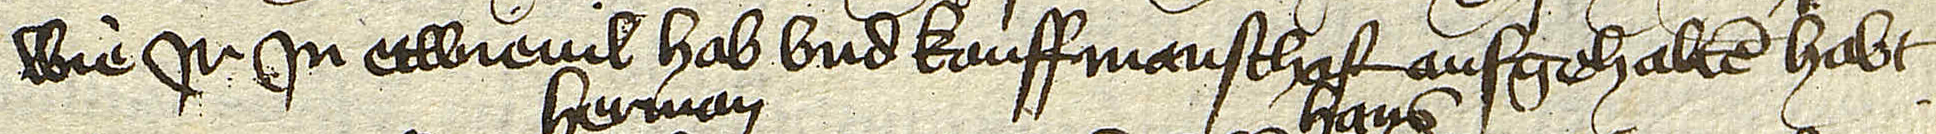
wie Ir In etwieuil hab vnd kauffmanſchaft aufgehalte* habt
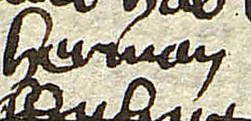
Herman
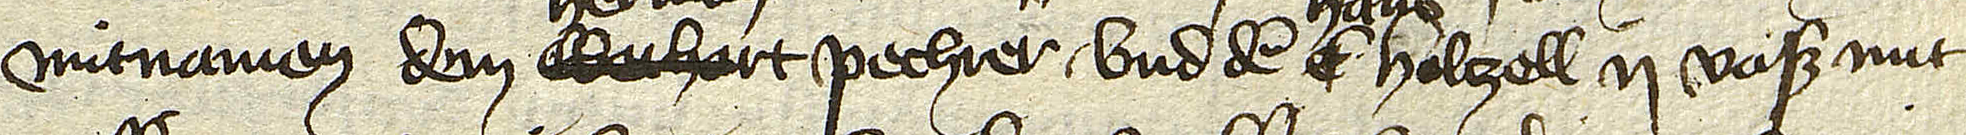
mitnamen dem Eberhart pechrer / vnd de* C holcʒell ii vaſʒ mit
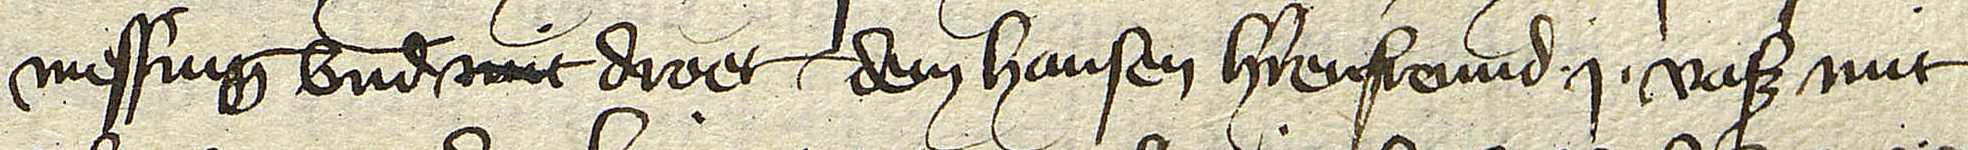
meſſing vnd mit droet / dem hanſen hr*enfreund i . vaſʒ mit
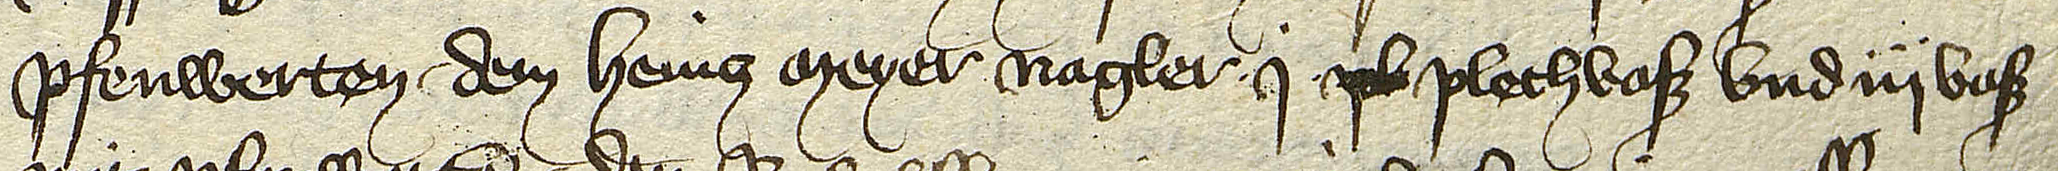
pfenwerten / dem Heincʒ Meyer Nagler i pl plechvaſʒ vnd iii vaſʒ
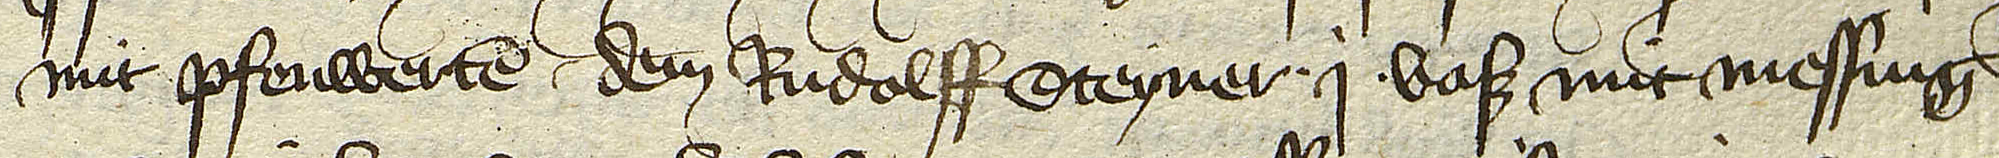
mit pfenwerte* / dem Rudolff Steyner i vaſʒ mit meſſing
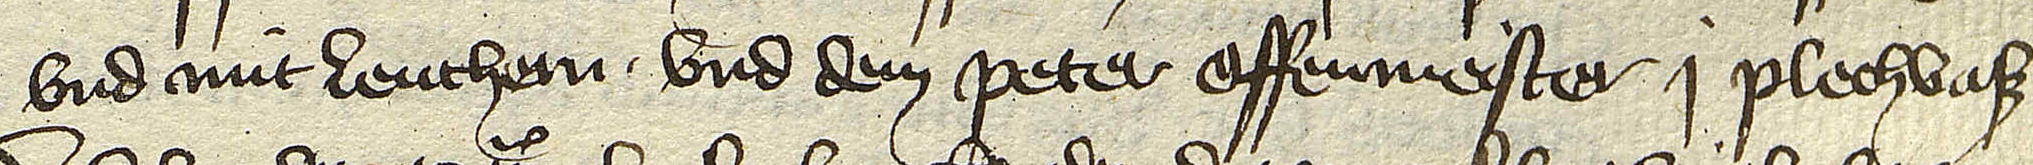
vnd mit leuthern . vnd dem peter Offenmeiſter i plechvaſʒ
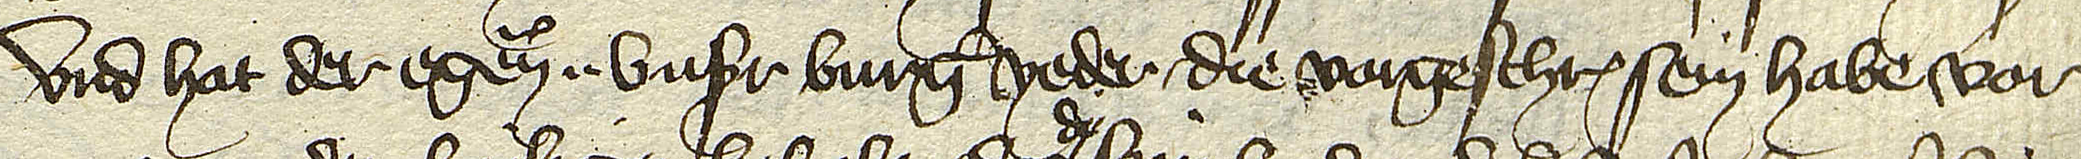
vnd hat der egen* ~ vnſ*r burg* yeder / die vorgeſchr* ſein habe vor
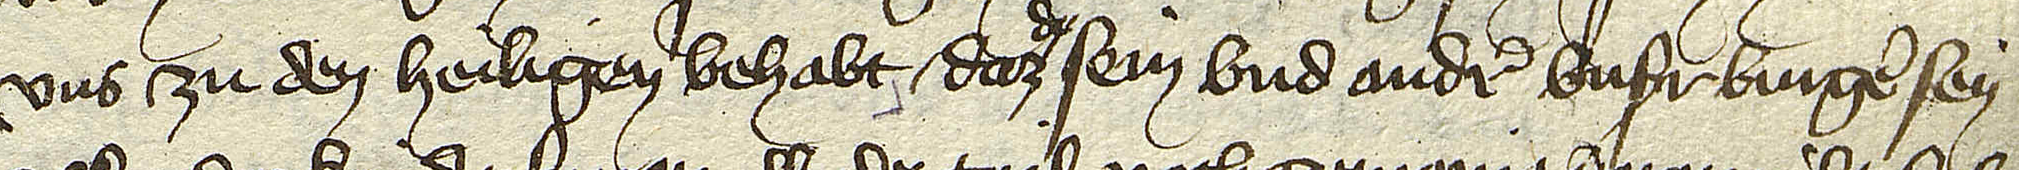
vns cʒu den heiligen behabt / daʒ ſein vnd andr* vnſ*r burge* ſey
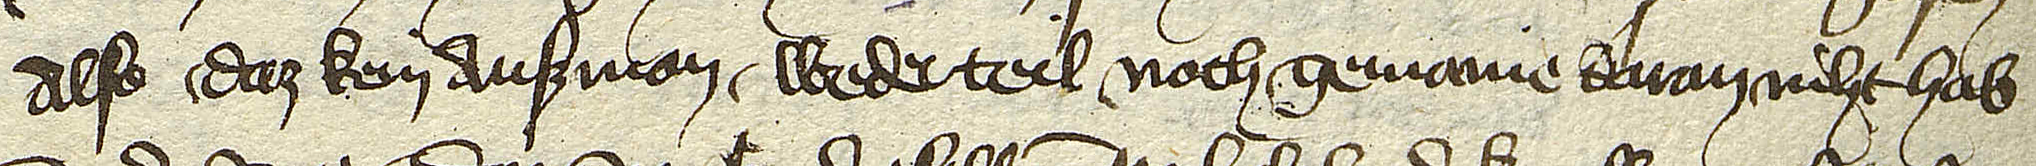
Alſo / daʒ kein Auſʒman / weder teil noch gemaine daran niht hab
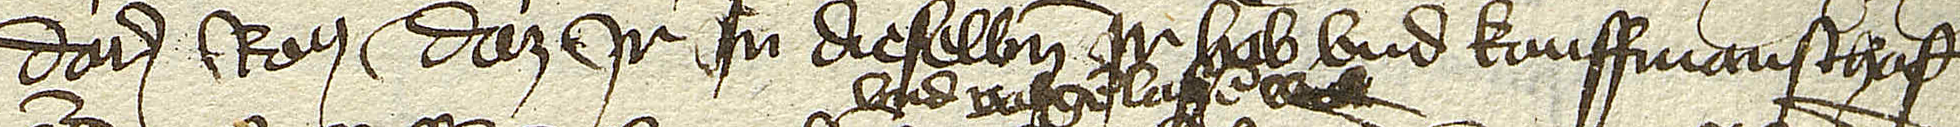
dar* Ro* / daʒ Ir In dieſelbn* Ir hab vnd kauffmanſchaft
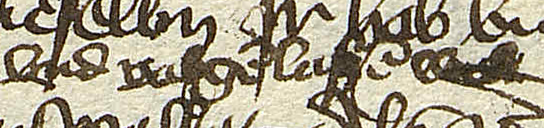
vnd volge* laſſe* wolt
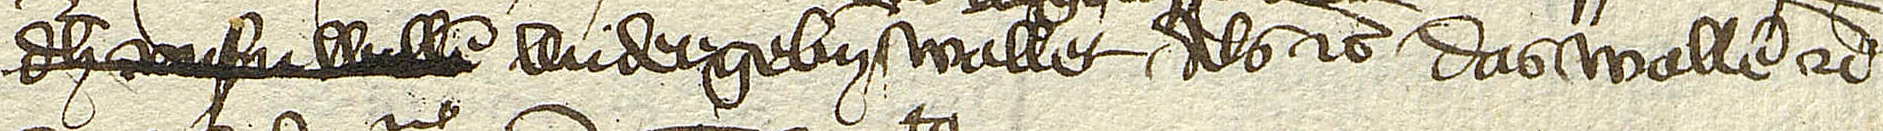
d*h vnſ*n wille* widergebn* wollet / Als ec* / das wolle* ec*
